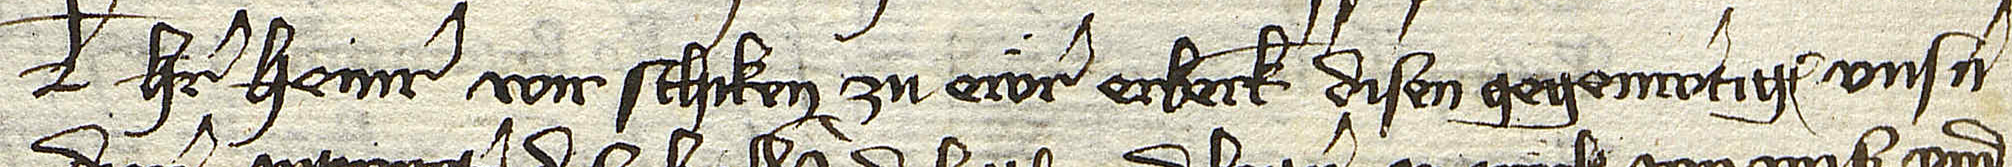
L* Hr* Heinr* wir ſchiken ʒu ewr* erberk* diſen gegenw*tig* vnſ*n
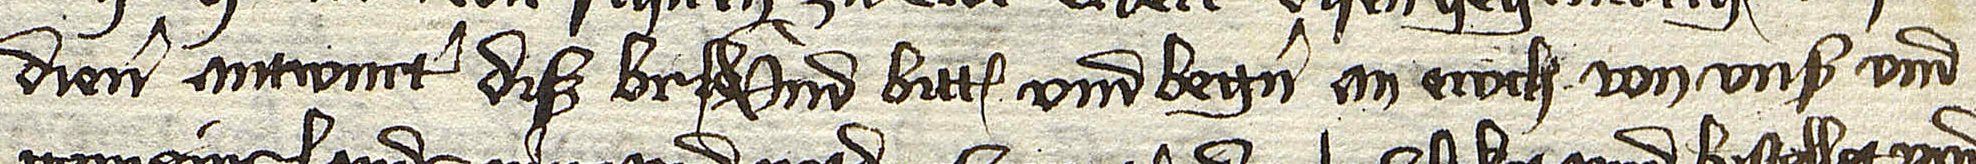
dien* antwurt* diſʒ brif Vnd bitt* . vnd beg*n an ewch . von vnſ* vnd
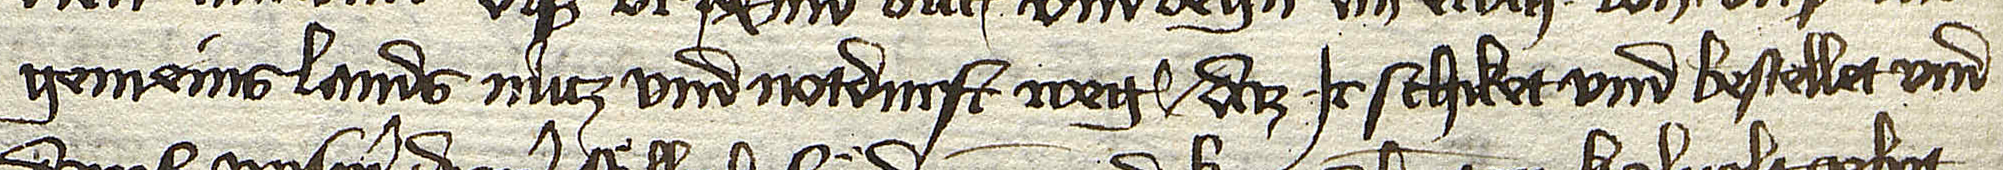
gemeinslands nucʒ vnd notdurft weg* / daʒ Ir ſchiket vnd beſtellet vnd
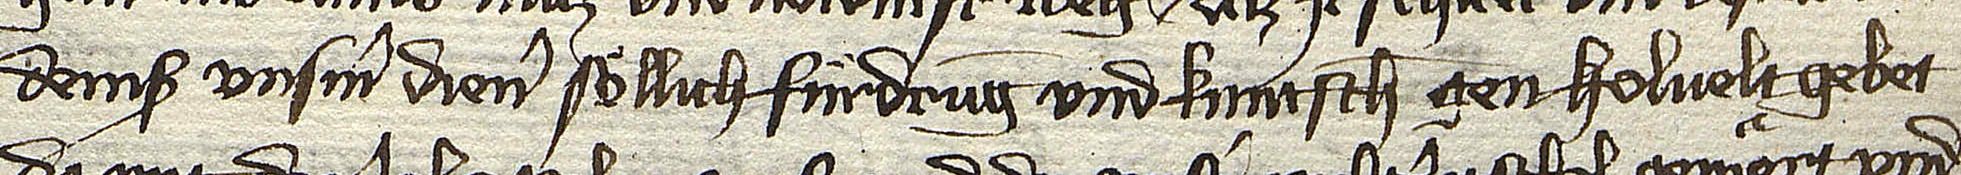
demſ* vnſ*m dien* ſöllich fürdrug* vnd kuntſch* gen Holuelt gebet
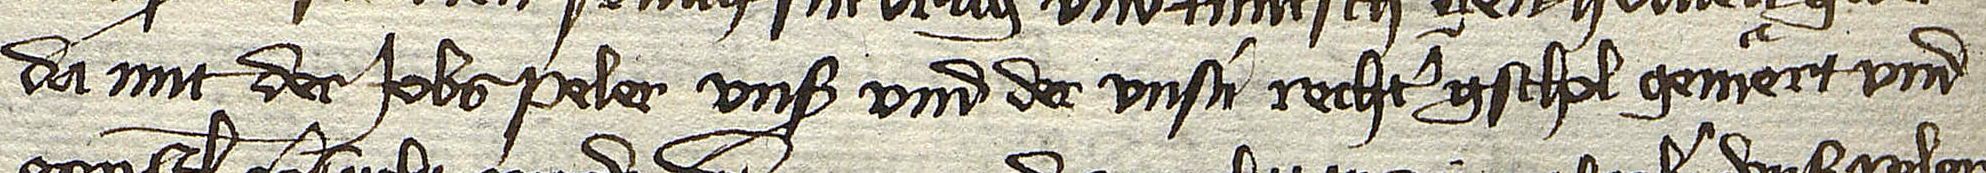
da mit der Iobs peler vnſ* vnd der vnſ*n recht gſchol gemërt vnd
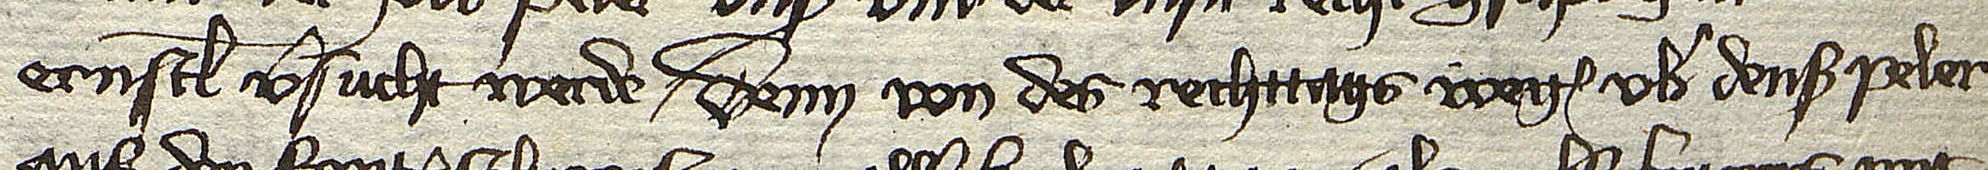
ernſtl* v*ſucht werde / Denn von des rechttags weg* vb* denſ* peler
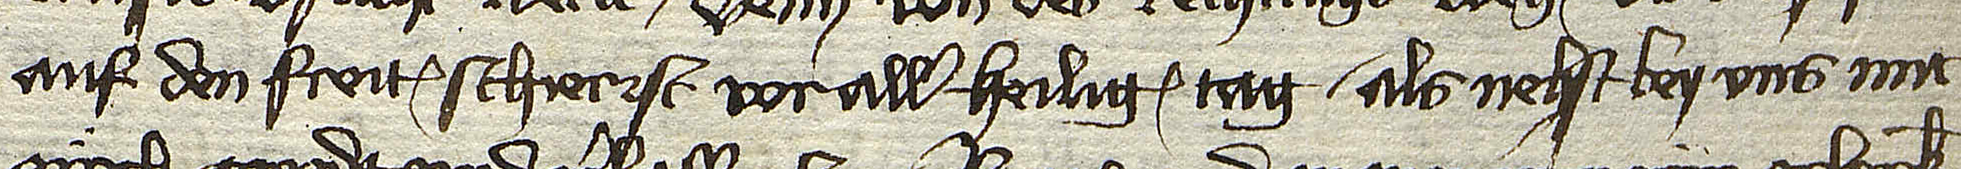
auf den freit* ſchieriſt vor all* Heilig* tag / als nehſt bey vns mit
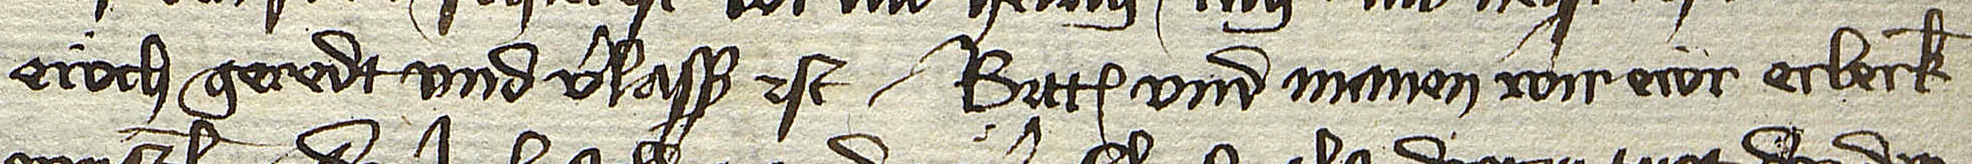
ewch geredt vnd verlaſſ* iſt / Bitt* vnd manen wir ewr erberk*
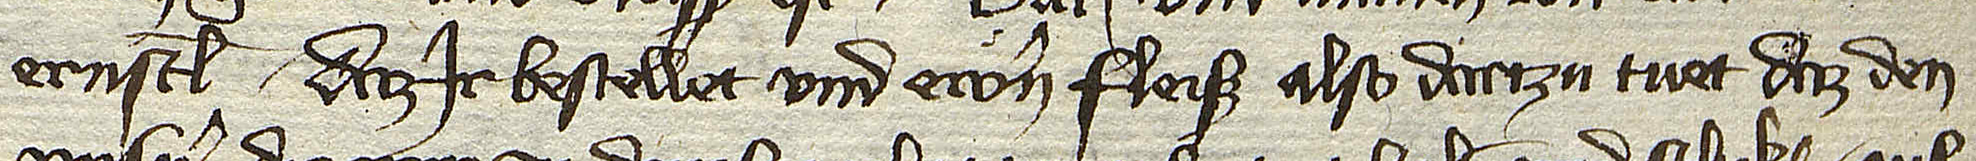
ernſtl* / Daʒ Ir beſtellet vnd ew*n fleiſʒ alſo darcʒu tuet daʒ den
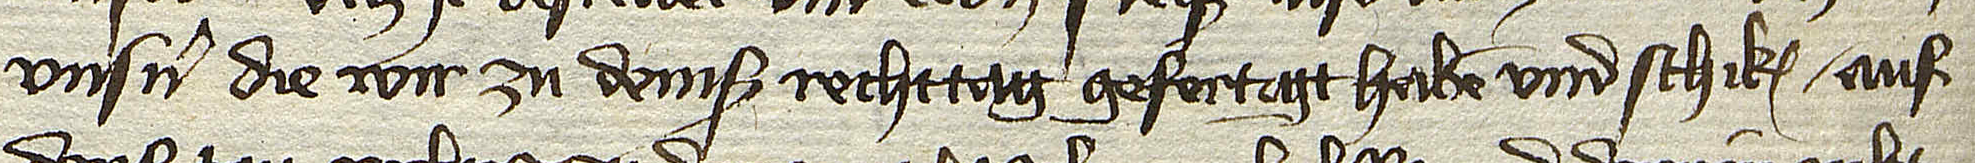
vnſn* die wir ʒu demſ* rechttag gefertigt habe* vnd ſchik* / auf
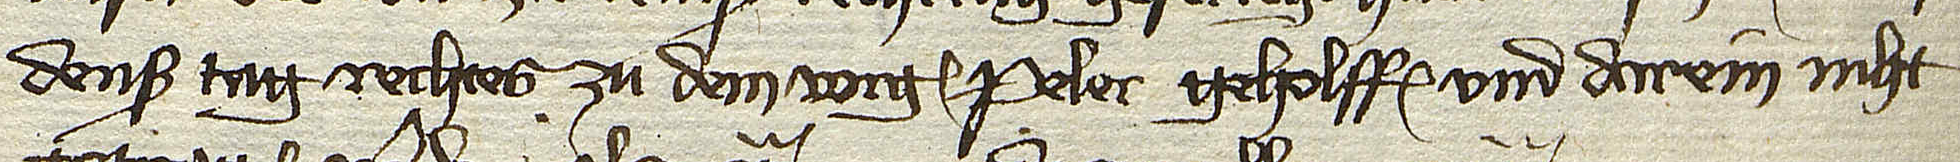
denſ* tag rechtes ʒu dem vorg* Peler geholff* vnd darein niht
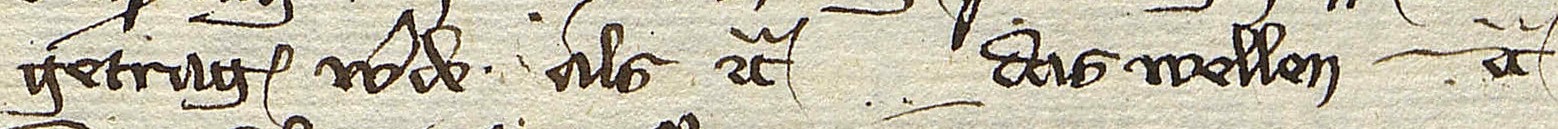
getrag* w*de . als ec* das wellen ec*
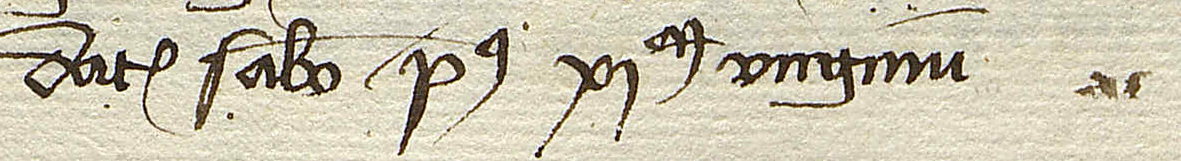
Dat* ſabo / p* xi* virginu*
